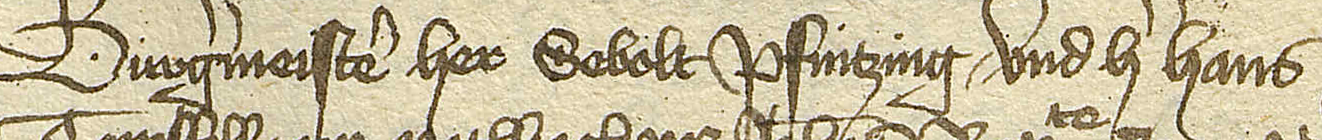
Burg*meiſte* her Sebolt Pfintʒing / vnd h* hans
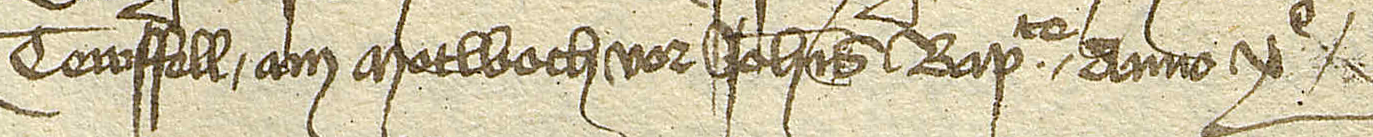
Tewffell / am Motwoch vor Iohis* Bap* . / Anno x* /
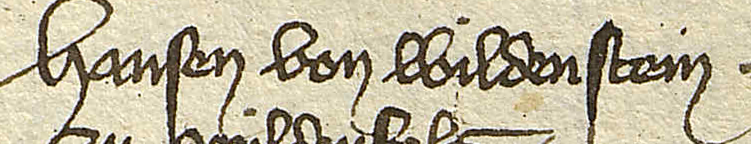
hanſen von Wildenſtein
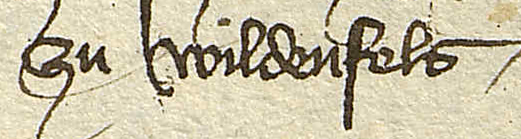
cʒu wildenfels /
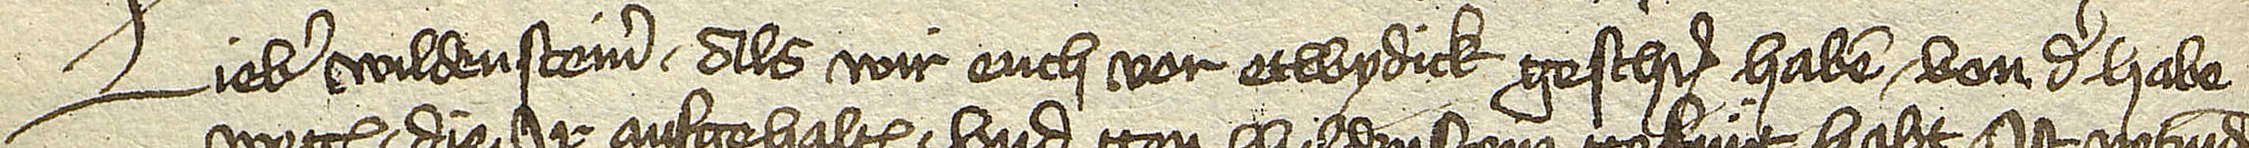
Lieb* wildenſtein* / Als wir euch vor etwydick geſchr* habe* / von d* habe
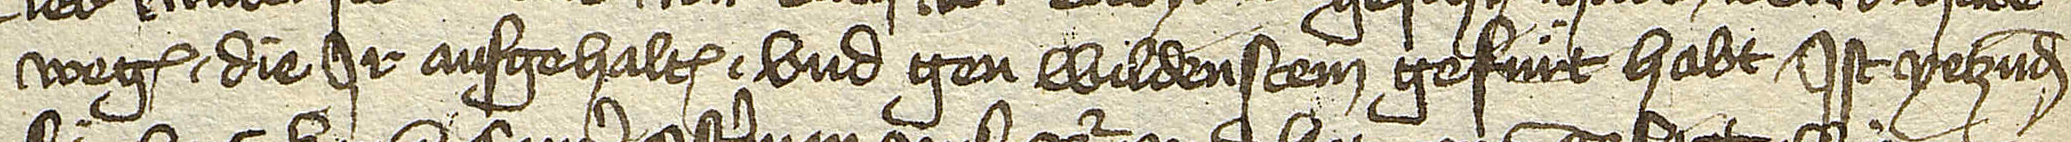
weg* / die Ir aufgehalt* / vnd gen wildenſtein gefürt habt / Iſt yecʒu*d*
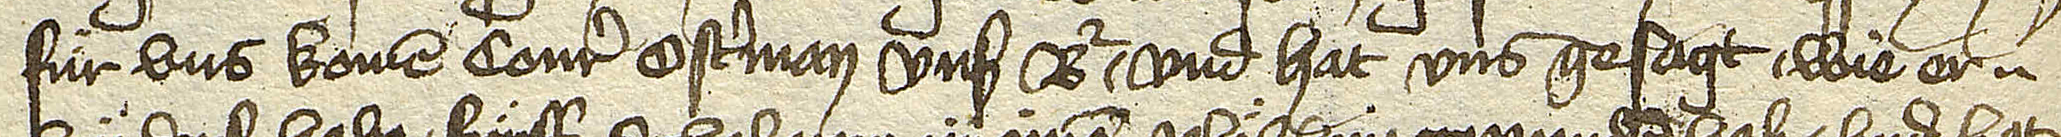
für vns kome* Conr* Oſt*man vnſ* B* / vnd hat vns geſagt / wie er ~
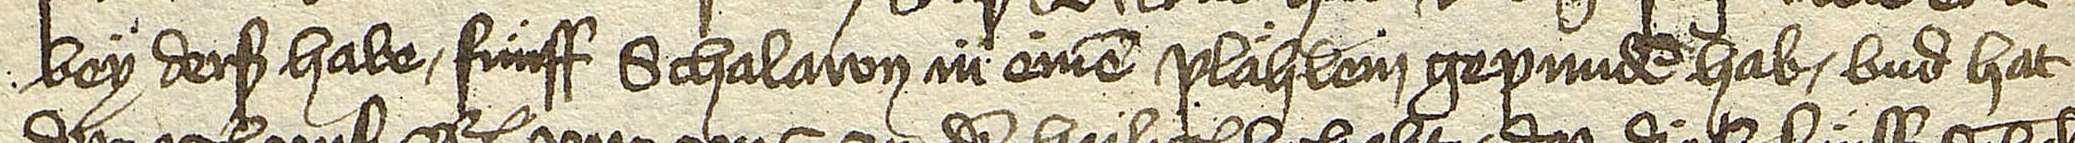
bey derſ* habe / fünff Schalawn in eine* plählein gepund* hab / vnd hat
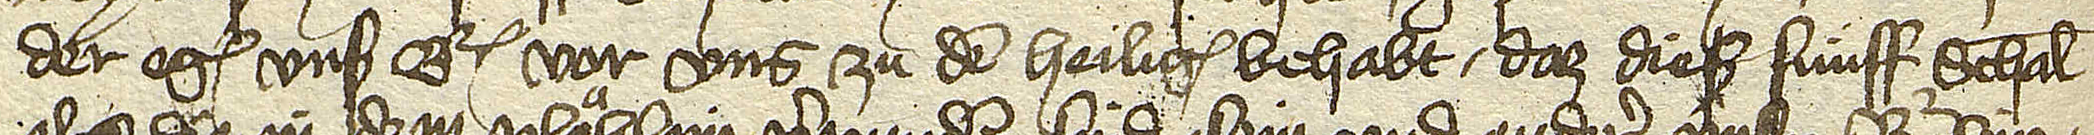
der eg* vnſ* B* vor vns cʒu de* heilige* behabt / daʒ dieſ* fünff Schal*
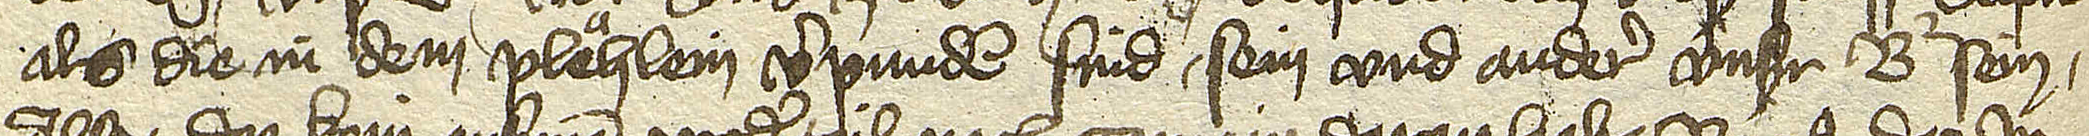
als die in dem plëhlein v*pund* ſind / ſein vnd ander* vnſn* B* ſein /
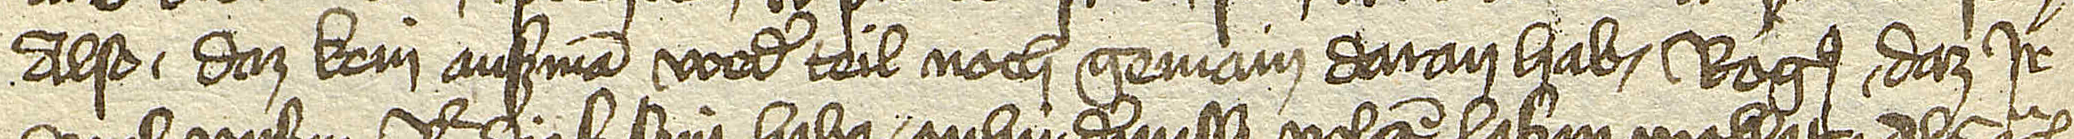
Alſo / daʒ kein auſʒma* wed* teil noch gemain daran hab / Rog* / daʒ Ir
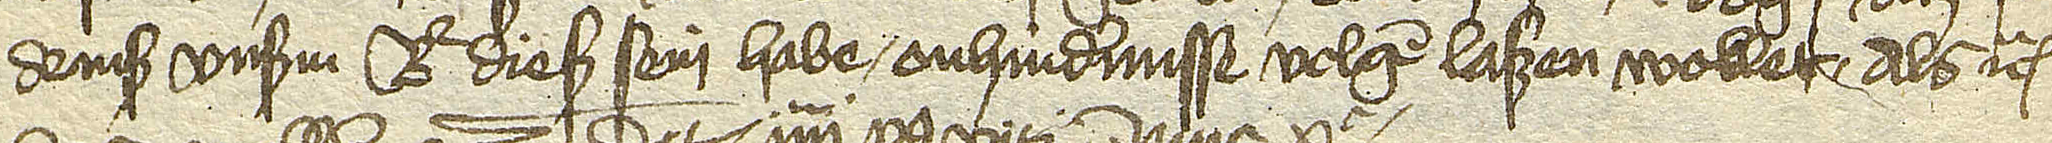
demſ* vnſ*m B* dieſ* ſein habe onhind*nuſſe volge* laſʒen wollet / als ec*
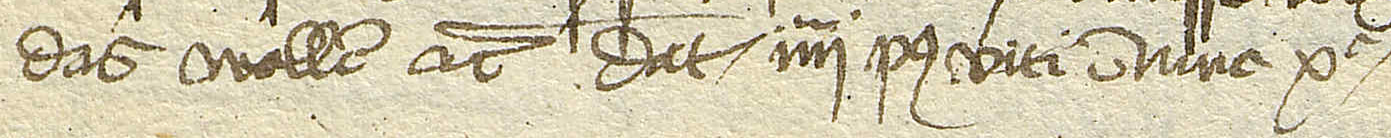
das wolle* ec* dat* iiii* p* viti Anno x* /
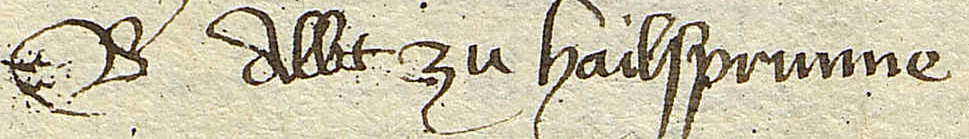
B* Abbt* cʒu Hailſprunne
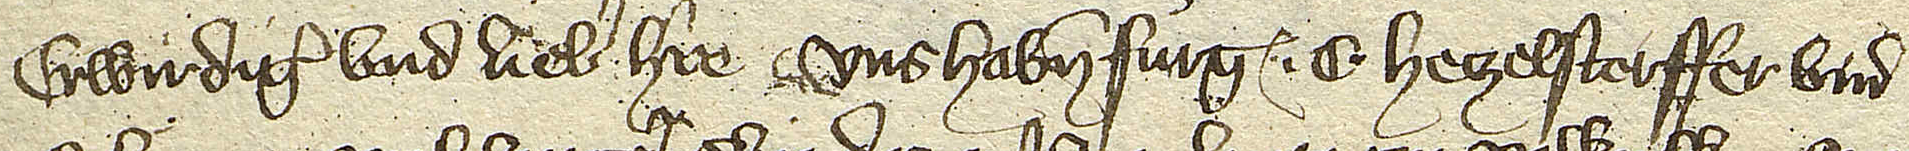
Erwirdig* vnd lieb* h*re / vns habn* fürg* . C . hecʒelſtorffer vnd
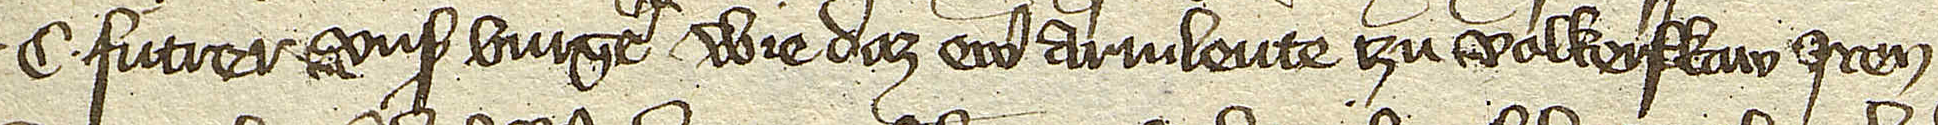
. C . fütrer vnſ* burge* / wie daʒ ew* Armleute cʒu volkerfkaw Iren
